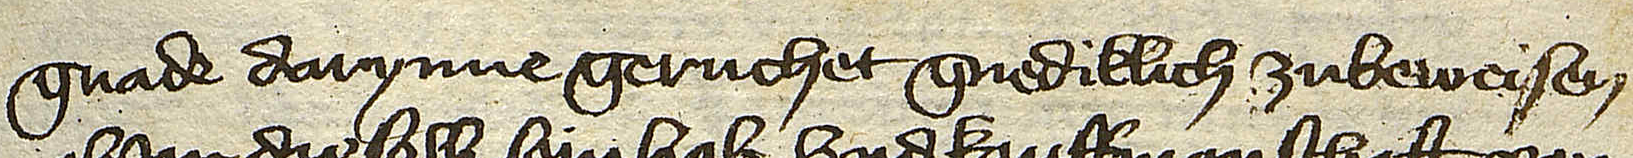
gnade darynne geruchet gnediklich cʒubeweiſen
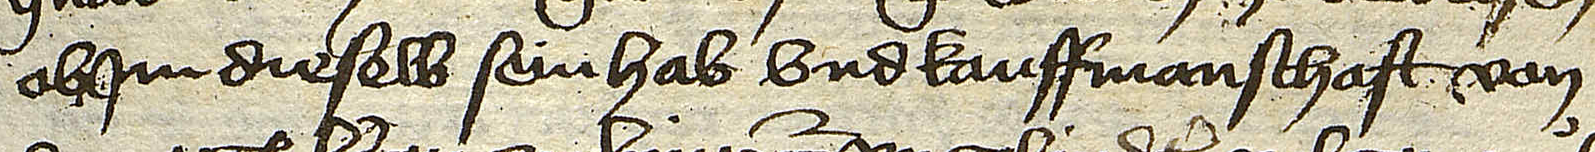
ob Im dieſelb ſein hab vnd kauffmanſchaft von
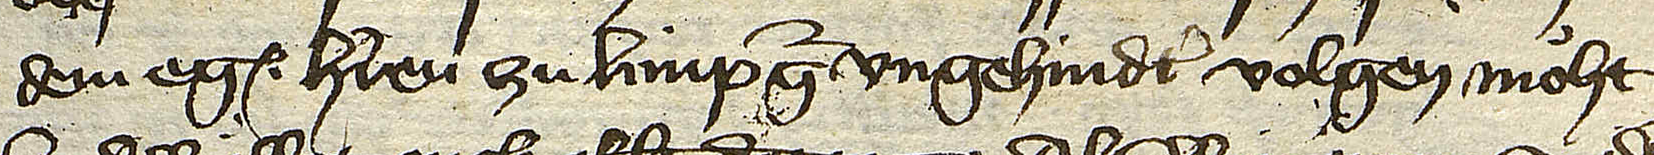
dem eg* . hren* cʒu limpg* vngehind*t volgen möht
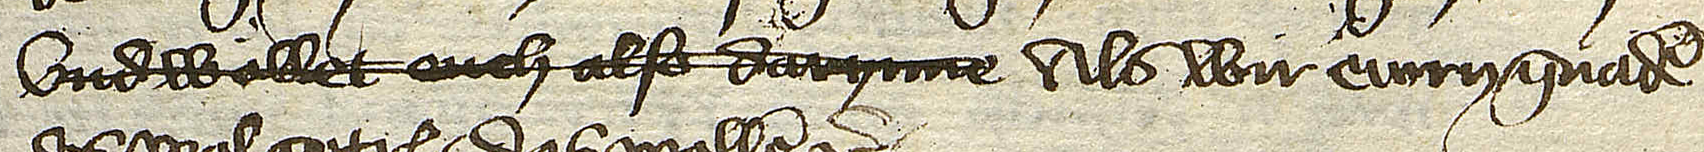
vnd wöllet euch alſo darynne Als wir ewrn gnad*
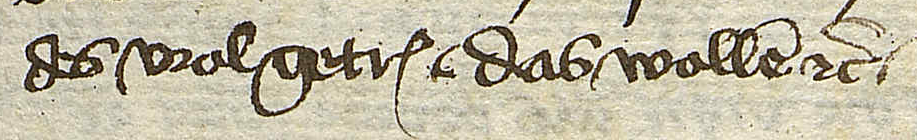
des wol getr* / das wolle* ec* /
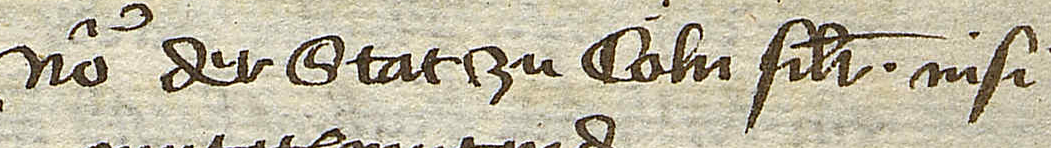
No* der stat cʒu Cöln ſilr* . niſi
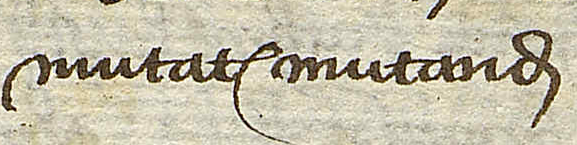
mutat* mutand*
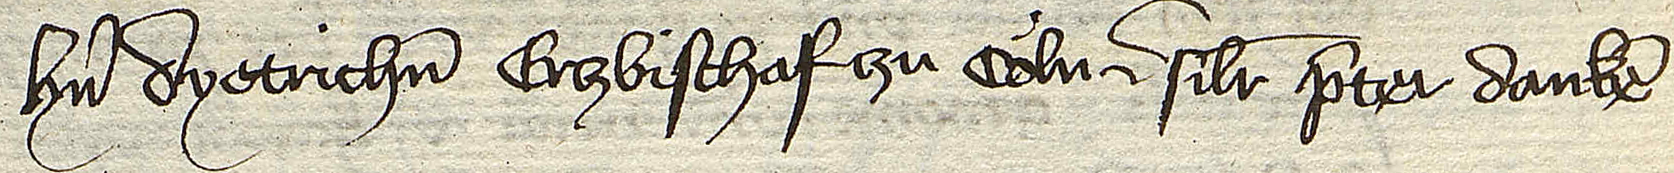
hn* Dyetrichn* Ercʒbiſchof cʒu Cöln ~ ec* ſilr* p*ter danke*
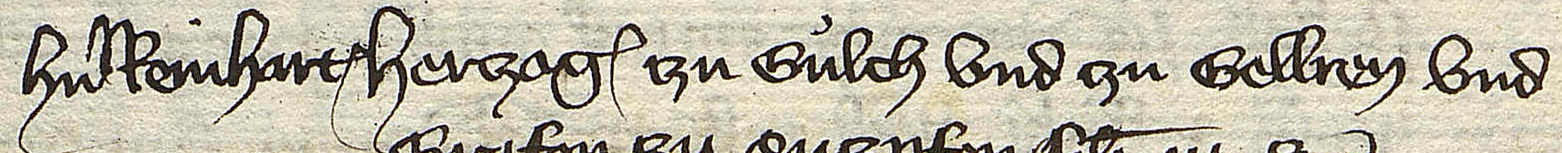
hn* Reinhart Hercʒog* cʒu Gülch vnd cʒu Gellren vnd
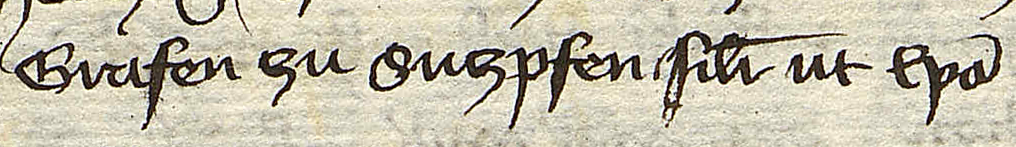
Grafen cʒu Sucʒpfen ſilr* ut Epo*
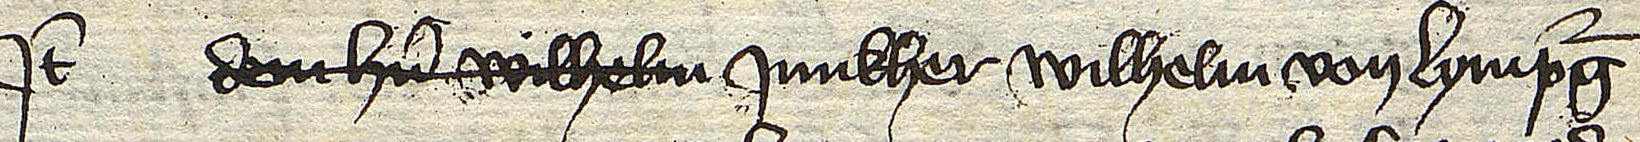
It* dem hn* wilhelm Iunkher wilhelm von Lympg*
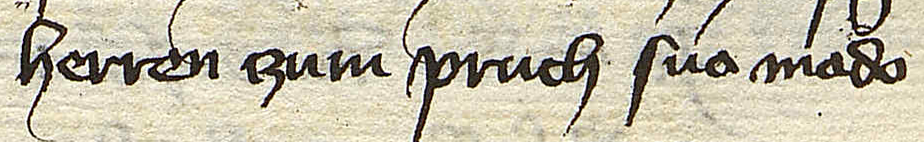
herren cʒum pruch ſuo modo
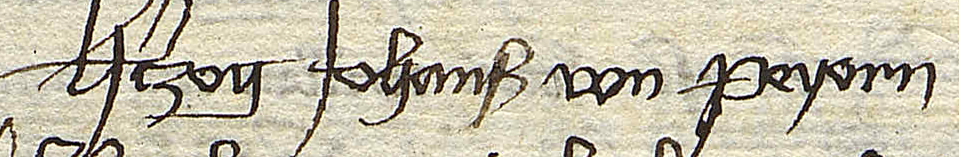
Hcʒog* Iohanſ* von Peyern
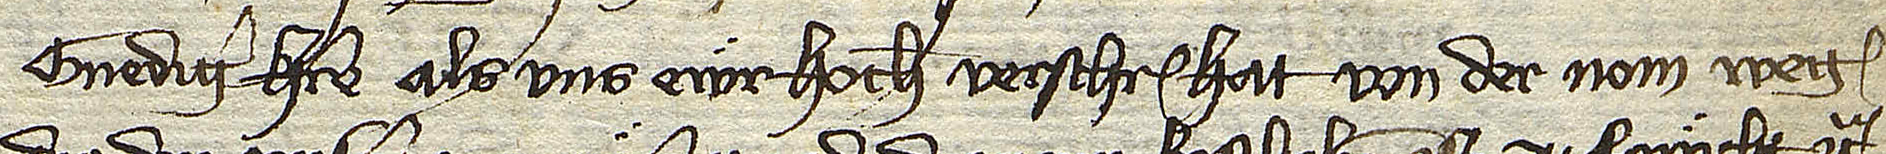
Gnedig* h*re als vns eẅr hoch* verſchr* hat von der nom weg*
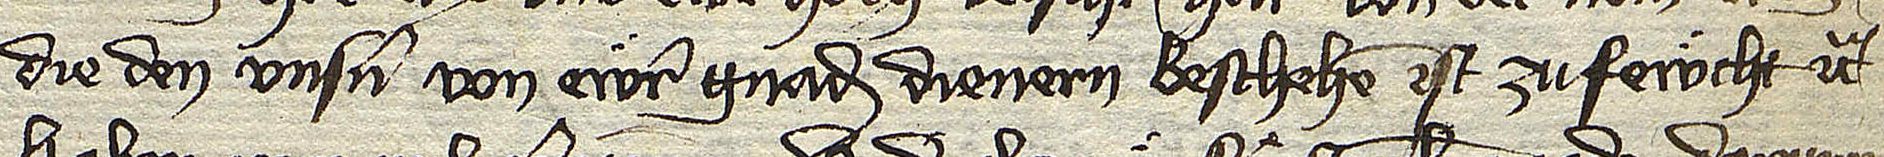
die den vnſ*n von eẅr* gnad* dienern beſchehe* iſt ʒu feẅcht ec*
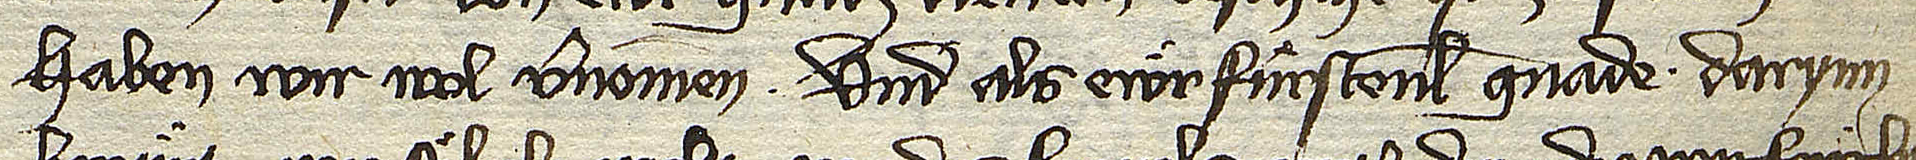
haben wir wol v*nom*en . Vnd als eẅr fürſtenl* gnade . darynn
